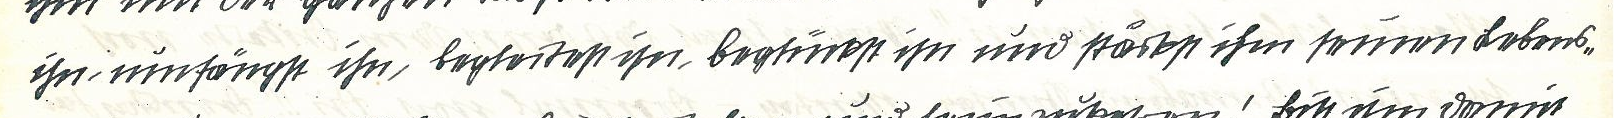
ihn, umfängst ihn, begleitest ihn, beglückst ihn und stärkst ihm seinen Lebens¬
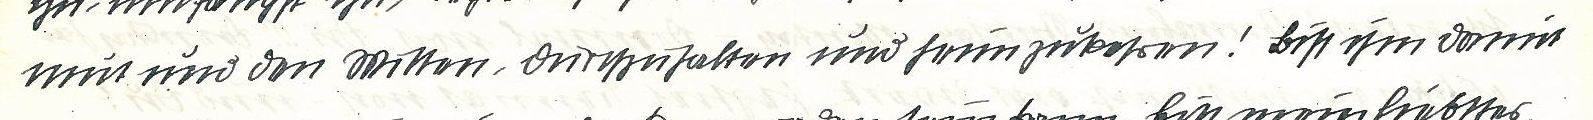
mut und den Willen, durchzuhalten und heimzukehren! Bist Ihm damit
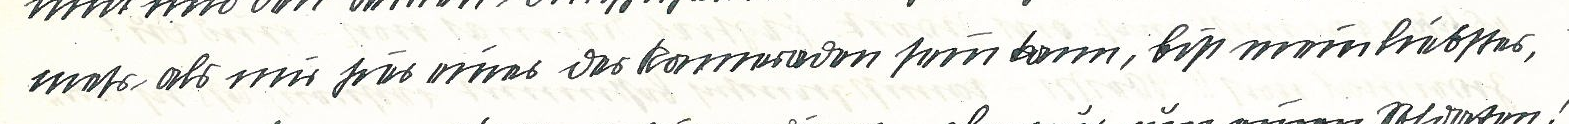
mehr, als mir hier einer der Kameraden sein kann, bist mein liebster,
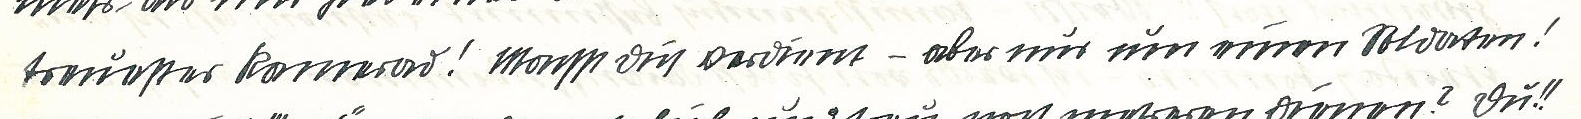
treuster Kamerad! Machst Dich verdient – aber nur um einen Soldaten!
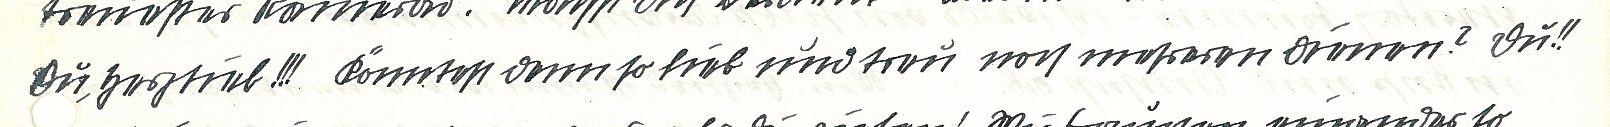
Du, Herzlieb!!! Könntest denn so lieb und treu noch mehreren dienen? Du!!
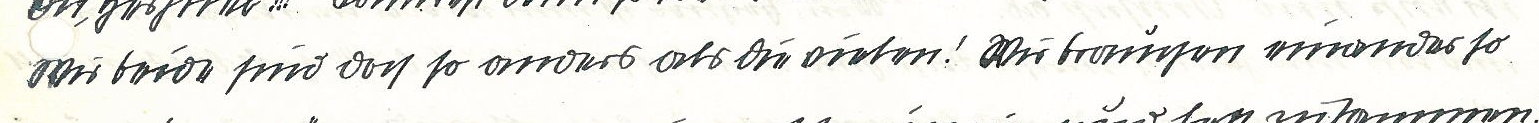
Wir beide sind doch so anders als die vielen! Wir brauchen einander so
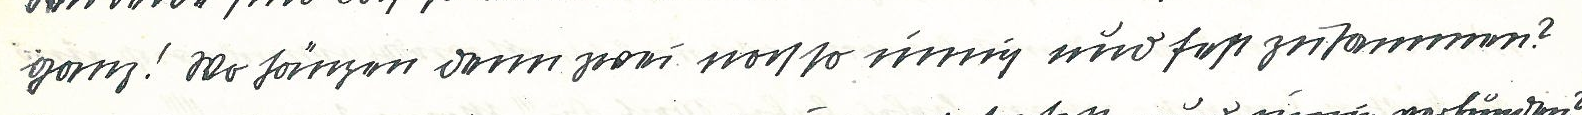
ganz! Wo hängen denn zwei noch so innig und fest zusammen?
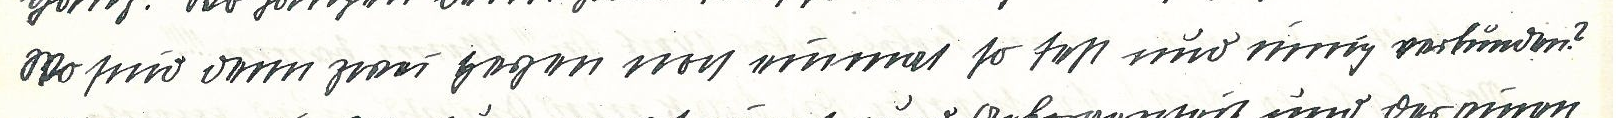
Wo sind denn zwei Herzen noch einmal so fest und innig verbunden?
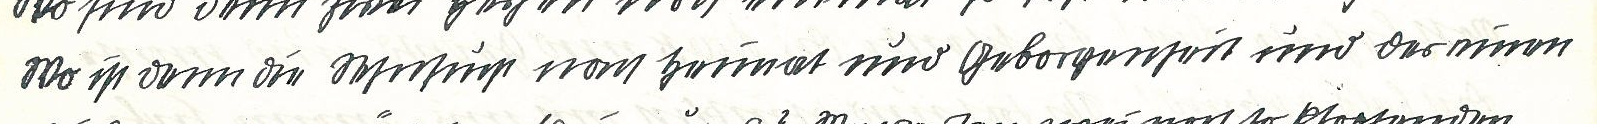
Wo ist denn die Sehnsucht nach Heimat und Geborgenheit und der einen
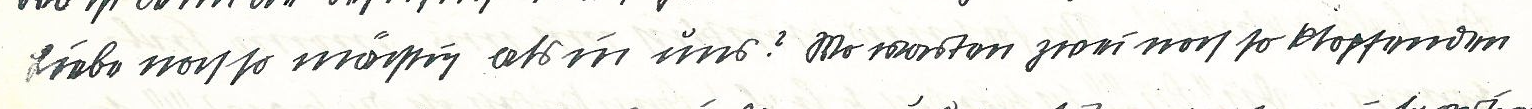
Liebe noch so mächtig als in uns? Wo warten zwei noch so klopfenden
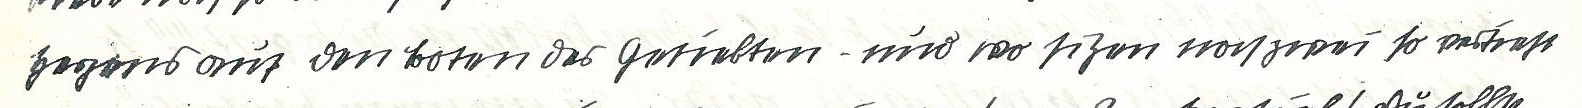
Herzens auf den Boten des Geliebten – und wo sitzen noch zwei so vertieft
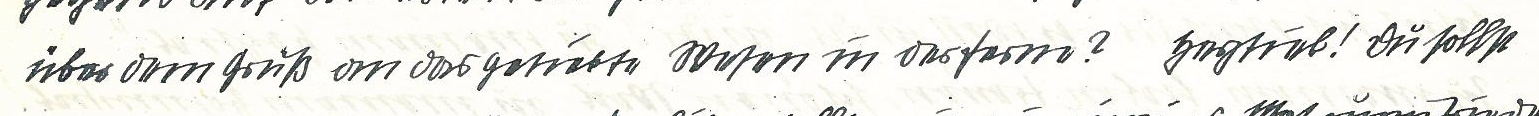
über dem Gruß an das geliebte Wesen in der Ferne? Herzlieb! Du sollst
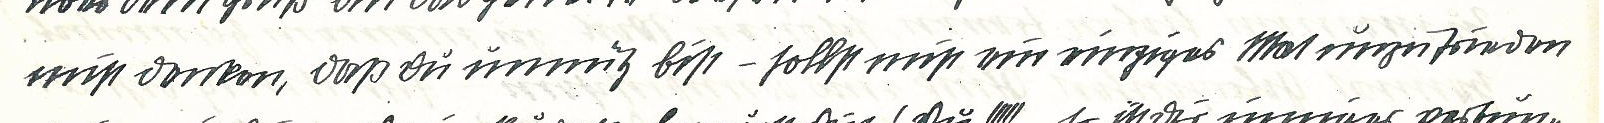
nicht denken, daß Du unnütz bist – sollst nicht ein einziges Mal unzufrieden
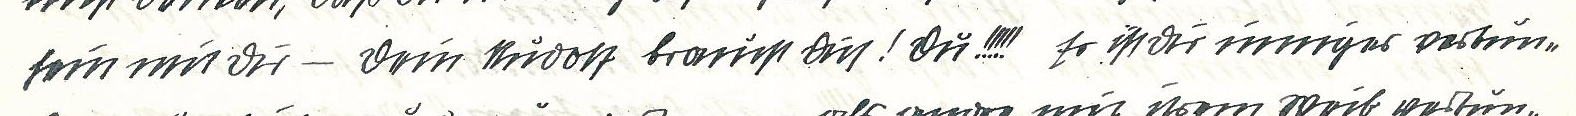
sein mit Dir – Dein Rudolf braucht Dich! Du!!!!! Er ist Dir inniger verbun¬
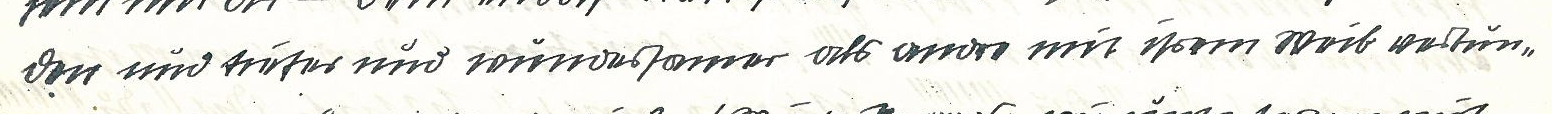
den und tiefer und wundersamer als andere mit ihrem Weib verbun¬
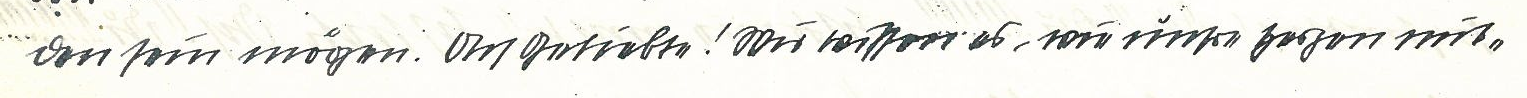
den sein mögen. Ach Geliebte! Wir wissen es, wie unsere Herzen mit¬
